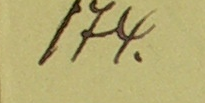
174
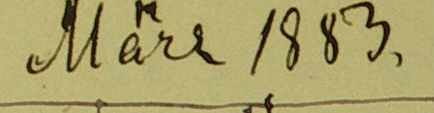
März 1883
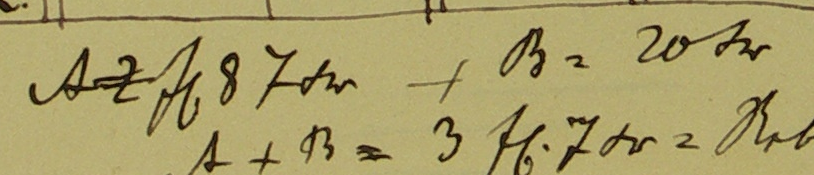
A = 2 Fl. 87. Tw + B= 20 Tw
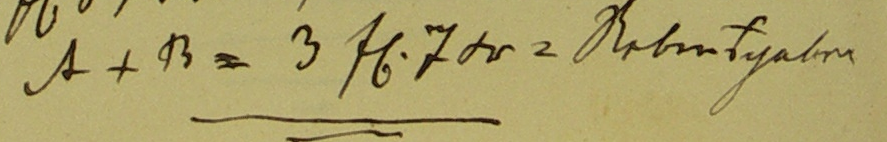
A + B = 3 Fl. 7 tw Nebenausgaben
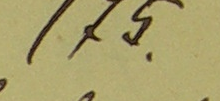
175
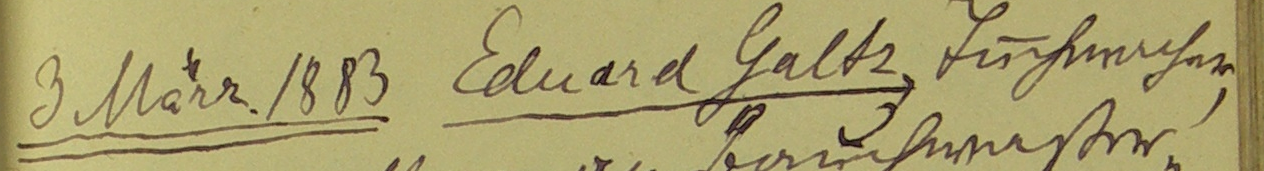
3 ??? 1883. ??? ???. Tuchmacher
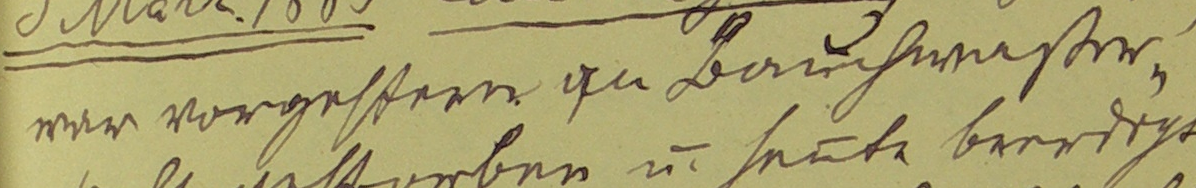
war vorgestern an Bauchwasser¬
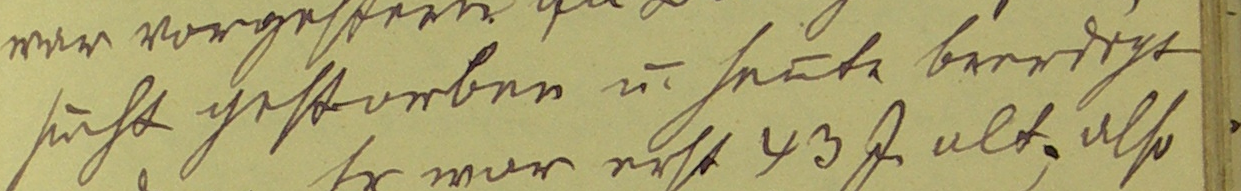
sucht gestorben u. heute beerdigt
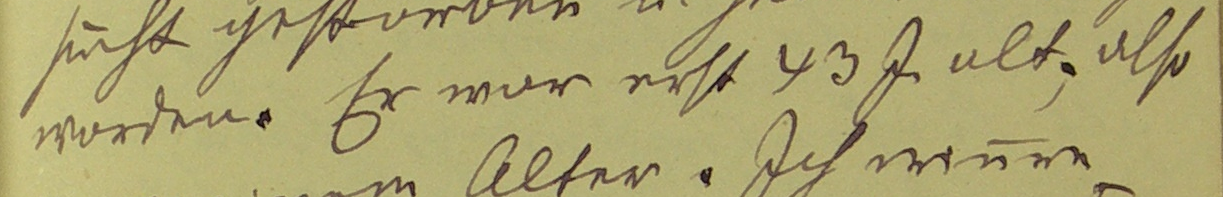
worden. Er war erst 43 J. alt; also
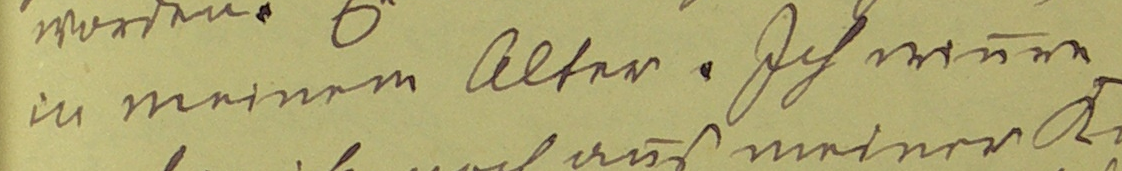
in meinem Alter. Ich erinnere
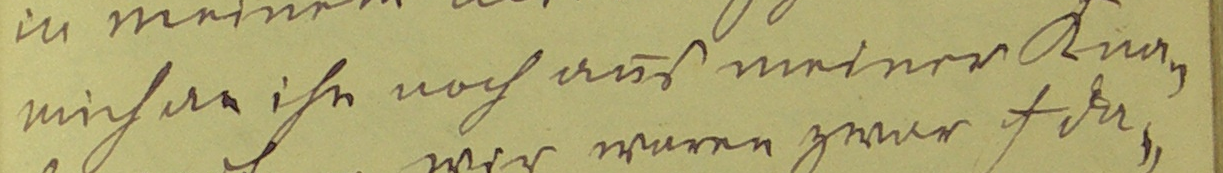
mich an ihn noch aus meiner Kna¬
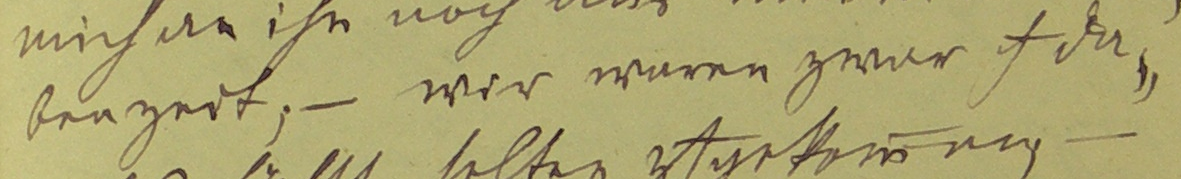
benzeit;- wir waren zwar ch da¬
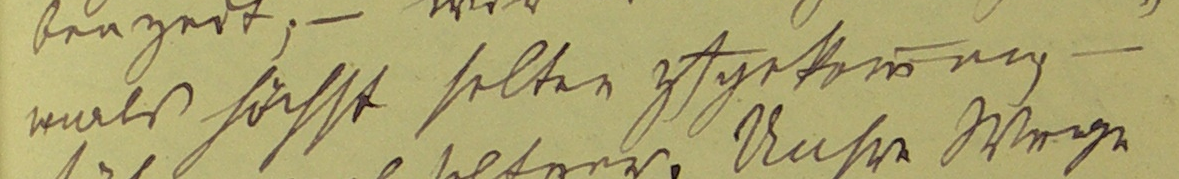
mals höchst selten zsgekommen,-
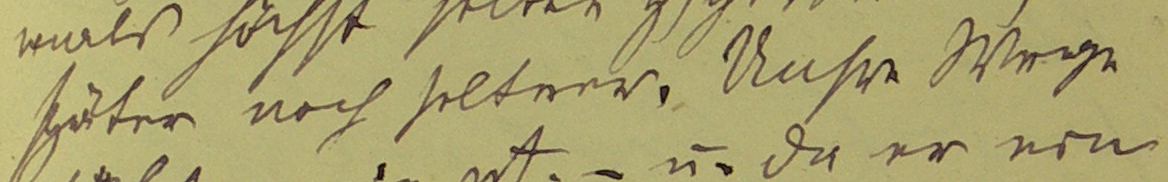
später noch seltener. Unsere Wege
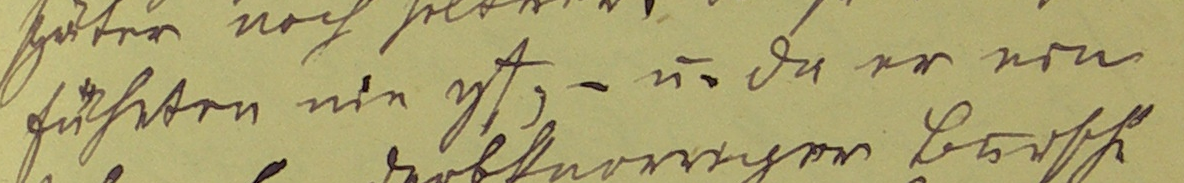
führten nie zs, - u. da er ein
